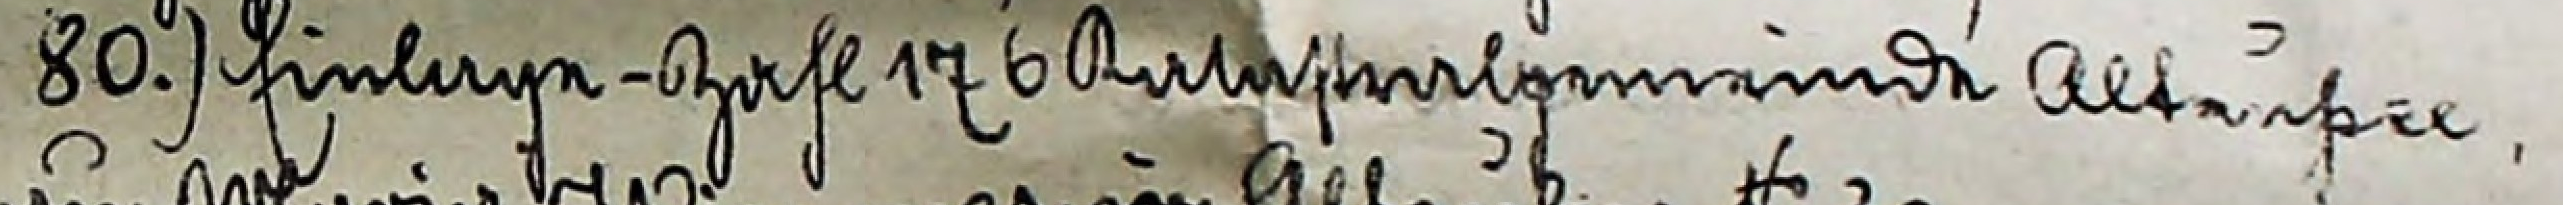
80.) Einlage - Zahl 176 Katastralgemeinde Altaussee,
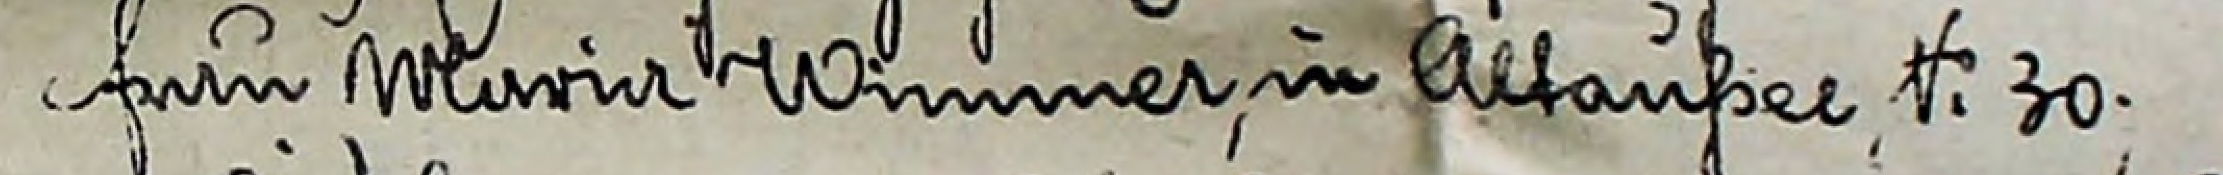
Frau Maria Wimmer, in Altaussee, № 30;
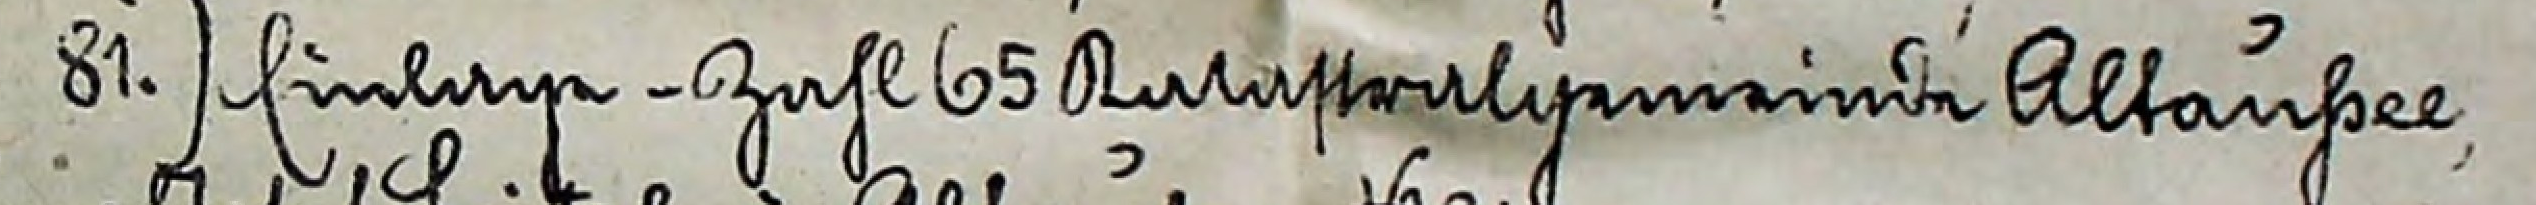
81.) Einlage - Zahl 65 Katastralgemeinde Altaussee,
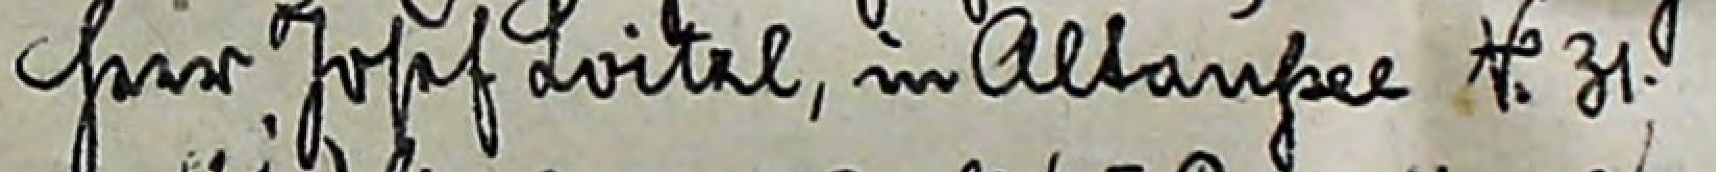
Herr Josef Loitzl, in Altaussee № 31;
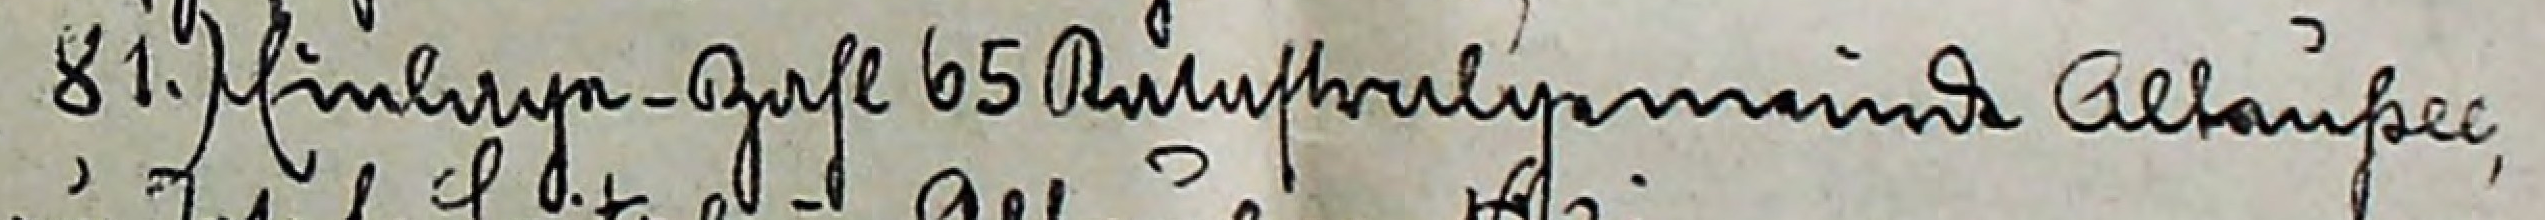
81.) Einlage - Zahl 65 Katastralgemeinde Altaussee,
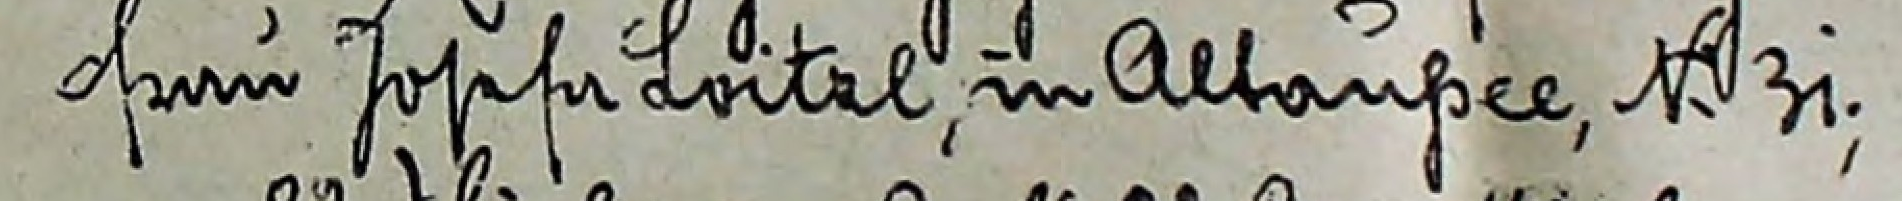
Frau Josefa Loitzl, in Altaussee, № 31;
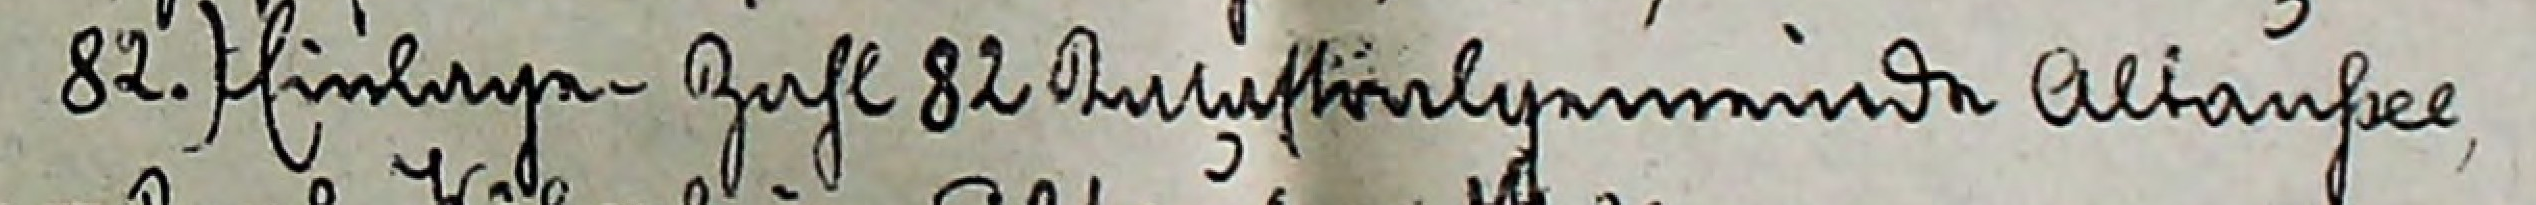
82.) Einlage - Zahl 82 Katastralgemeinde Altaussee,
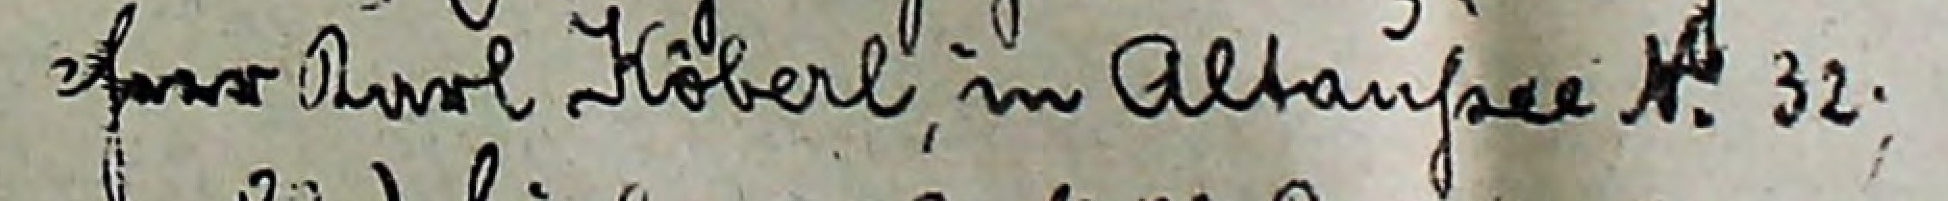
Herr Karl Köberl, in Altaussee № 32;
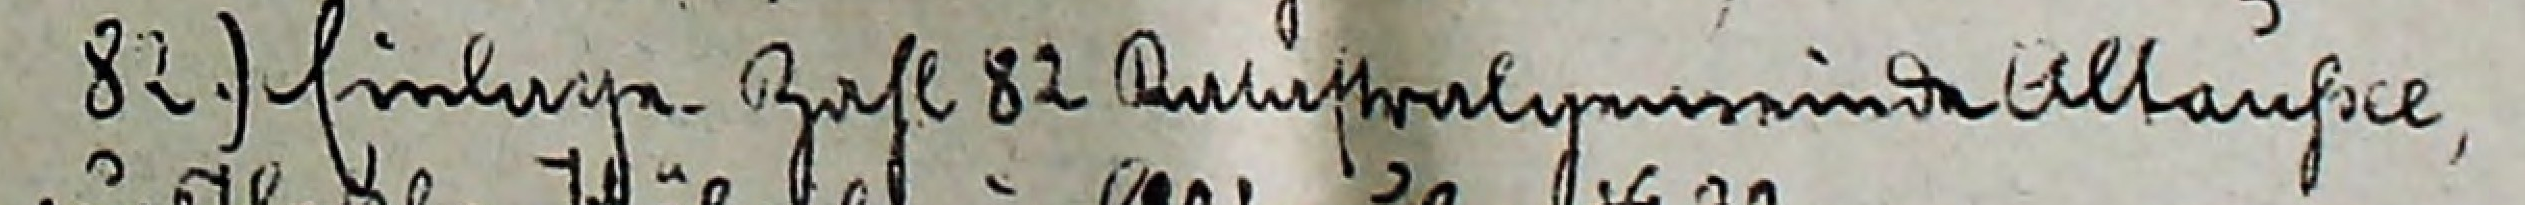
82.) Einlage - Zahl 82 Katastralgemeinde Altaussee,
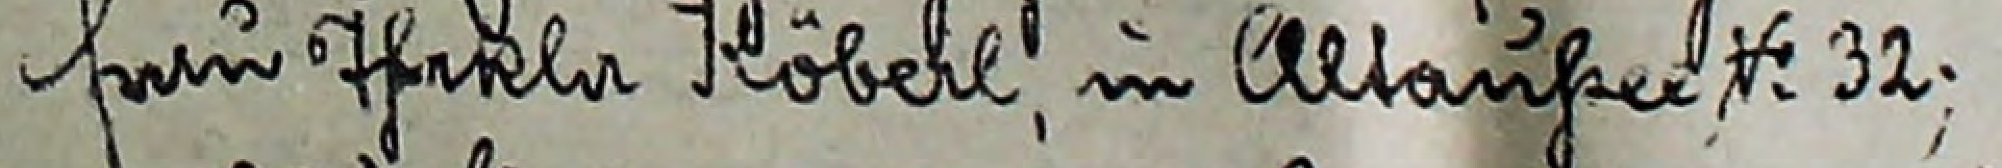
Frau Thekla Köberl, in Altaussee № 32;
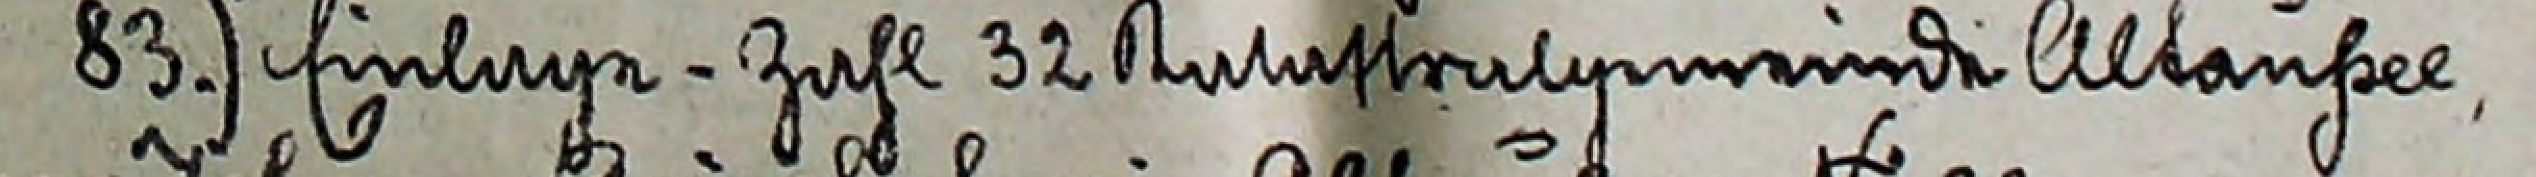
83.) Einlage - Zahl 32 Katastralgemeinde Altaussee,
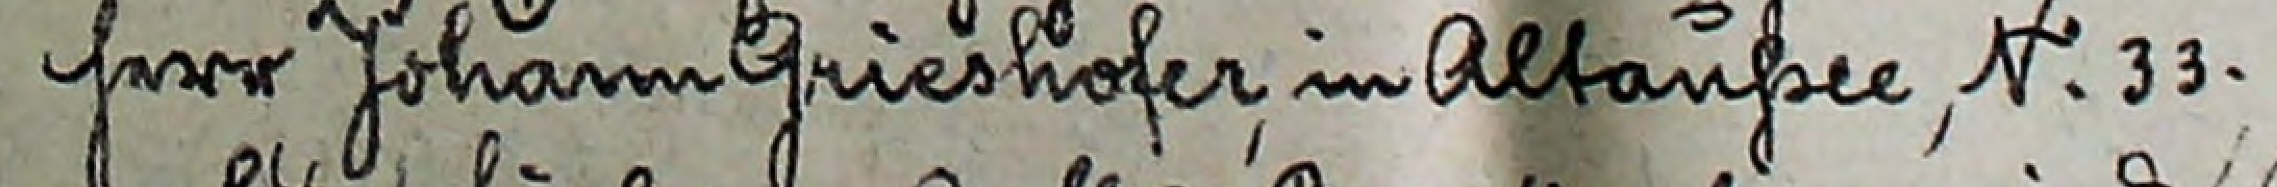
Herr Johann Grieshofer, in Altaussee, № 33;
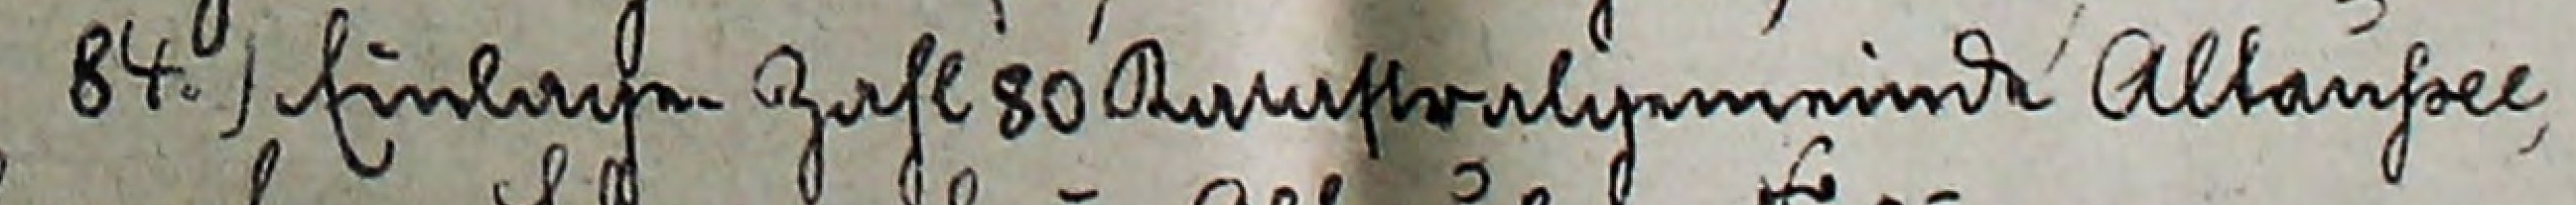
84.) Einlage - Zahl 80 Katastralgemeinde Altaussee,
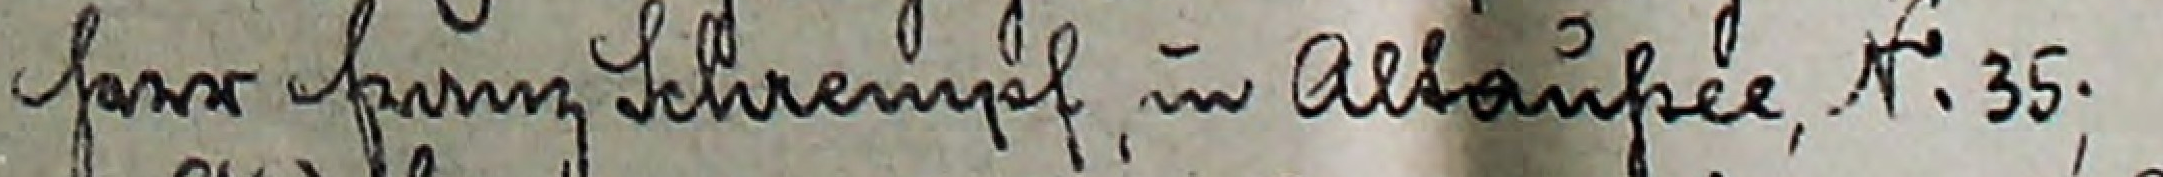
Herr Franz Schrempf, in Altaussee, № 35;
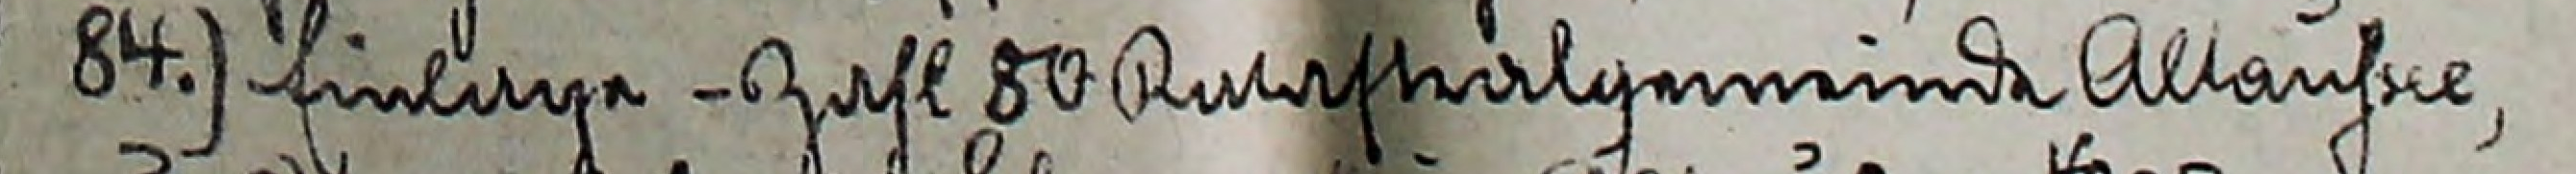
84.) Einlage - Zahl 80 Katastralgemeinde Altaussee,
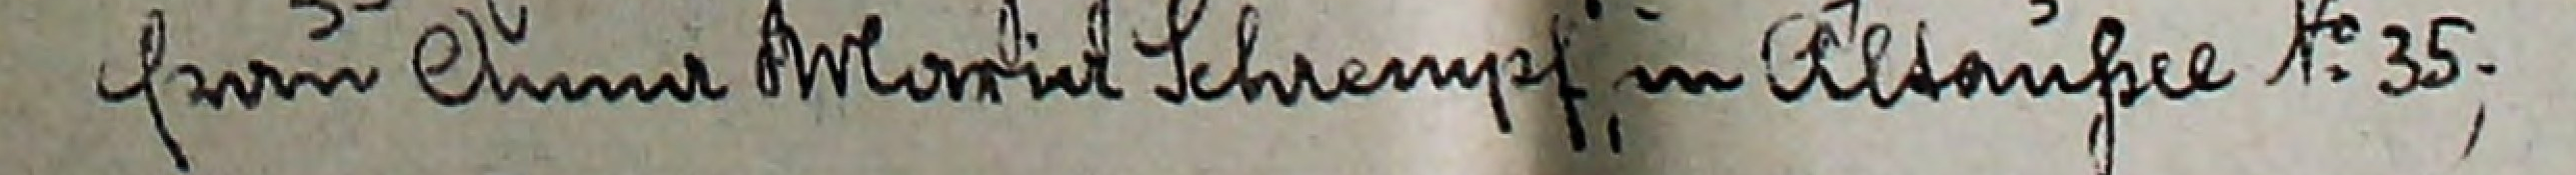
Frau Anna Maria Schrempf, Altaussee № 35;
